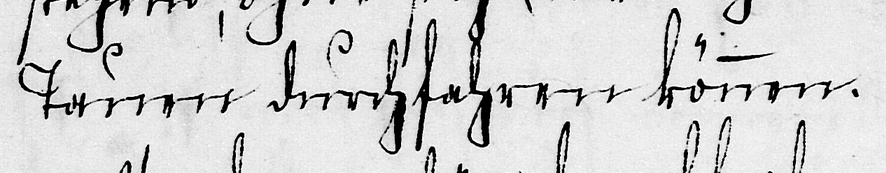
Tauen durchfahren können.
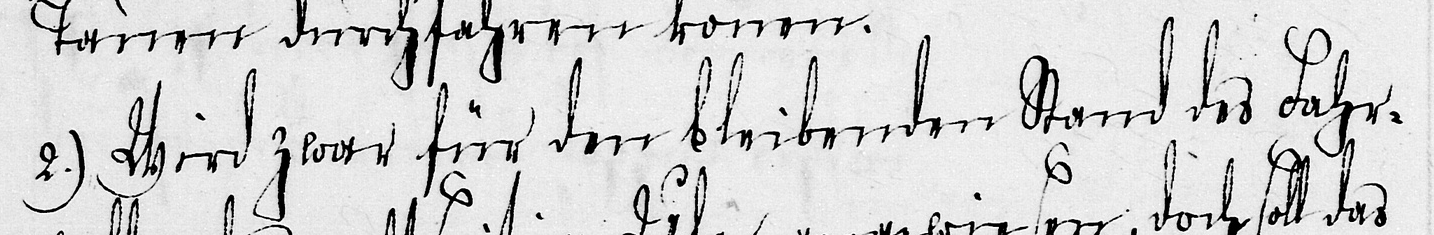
2.) Wird zwar für den bleibenden Stand des Fahr¬
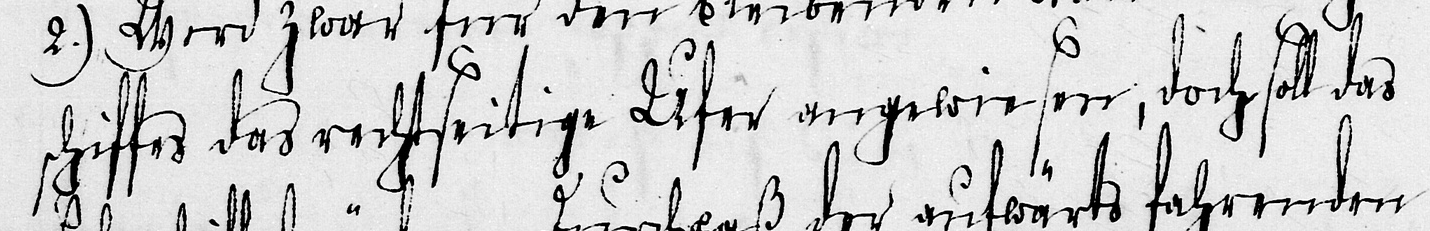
schiffes das rechtseitige Ufer angewiesen, doch soll das
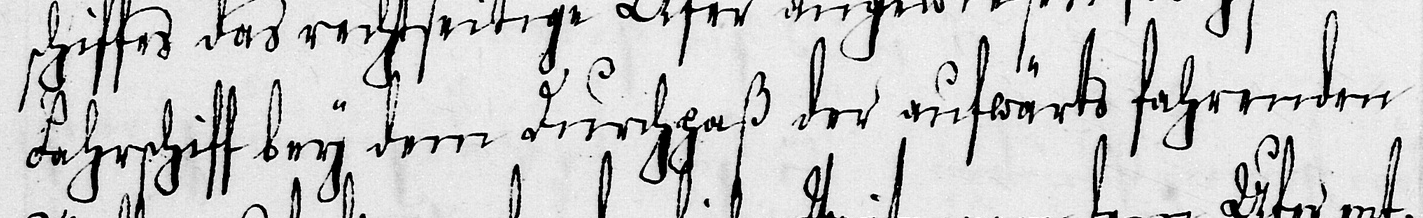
Fahrschiff bey dem Durchpaß der aufwärts fahrenden
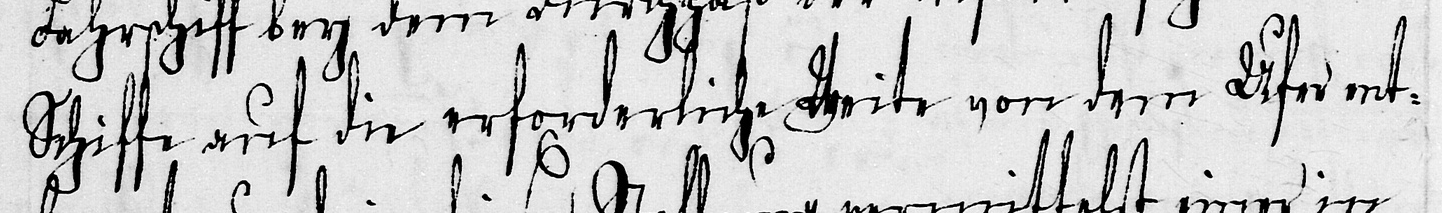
Schiffe auf die erforderliche Seite von dem Ufer ent¬
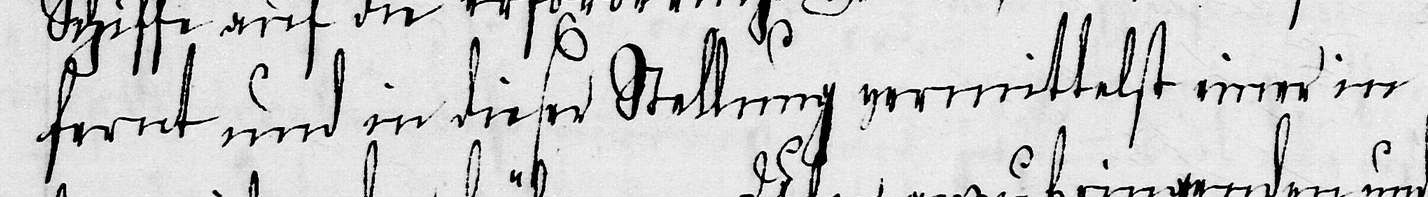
fernt und in dieser Stellung vermittelst einer in
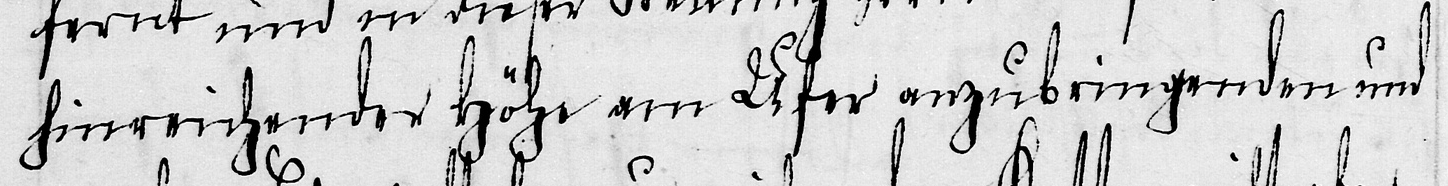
hinreichender Höhe am Ufer anzubringenden und
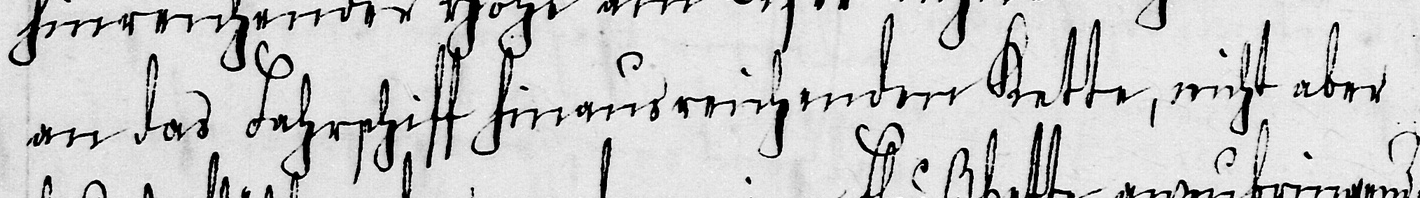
an das Fahrschiff hinausreichenden Kette, nicht aber
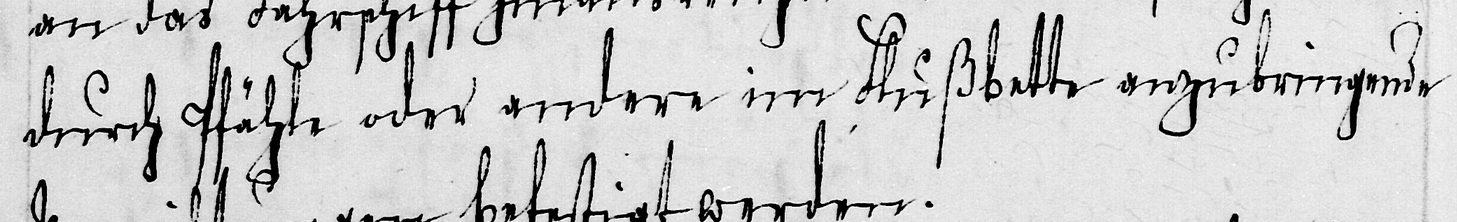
durch Pfähle oder andere im Flußbette anzubringende
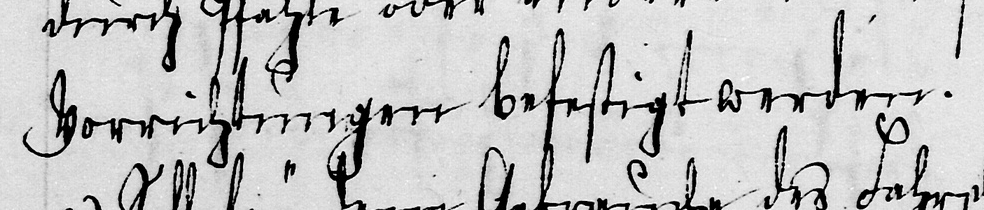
Vorrichtungen befestigt werden.
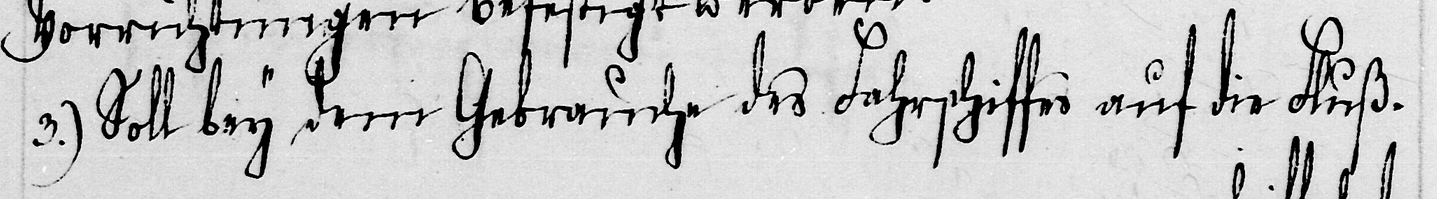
3.) Soll bey dem Gebrauche des Fahrschiffes auf die Fluß-
